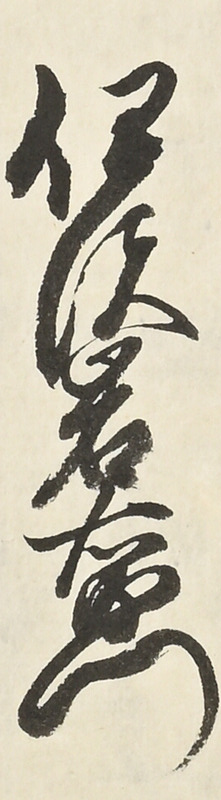伊沢岩右衛門
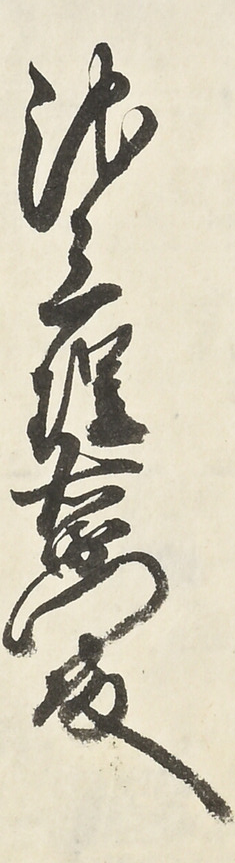池上理右衛門殿
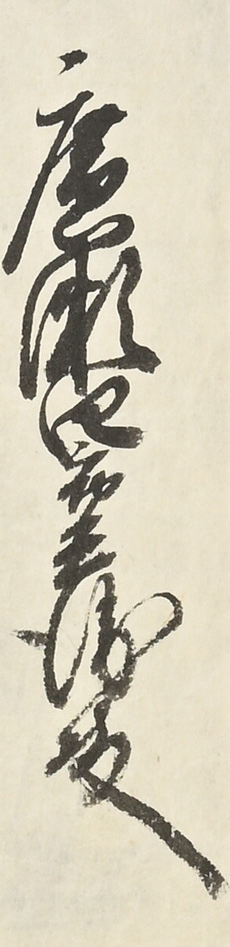広瀬四郎兵衛殿
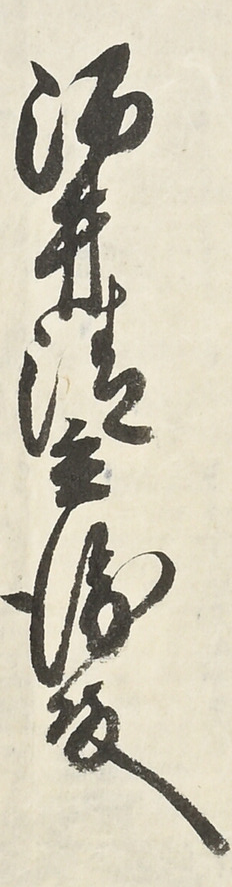酒井清兵衛殿

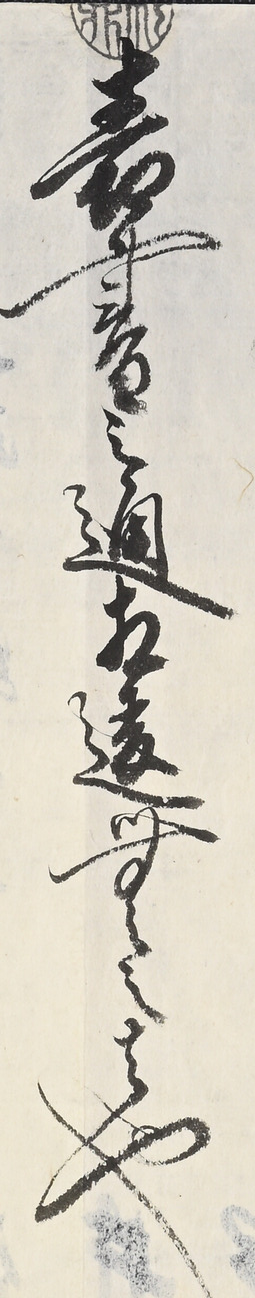㊞表書之通相違無之者也
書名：覚
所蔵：伊那市立高遠町図書館・合同会社AMANE
